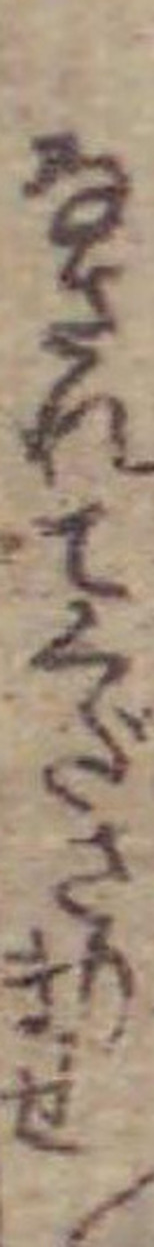なされてくださりませ

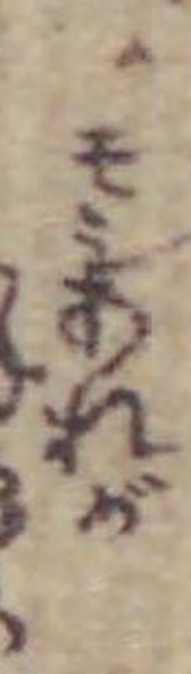モシあれが
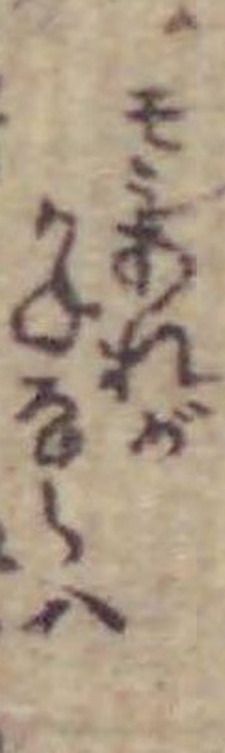かねならは
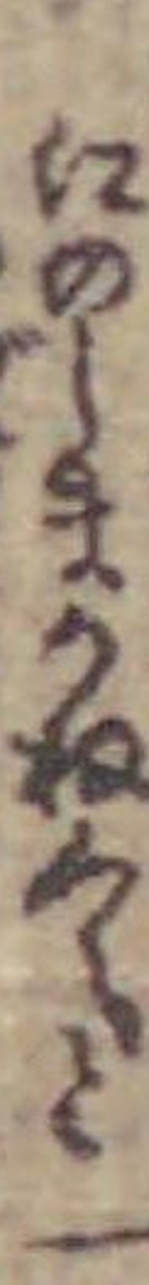江のしまかねくらと
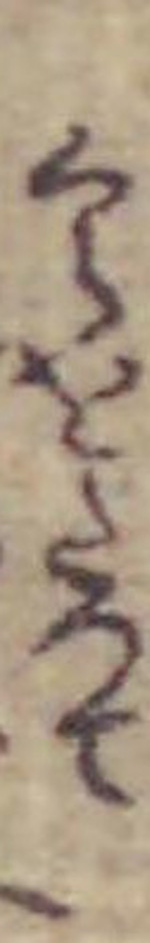くらをたつて
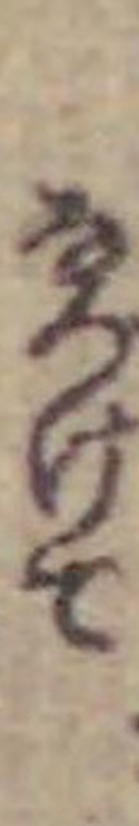なづけて
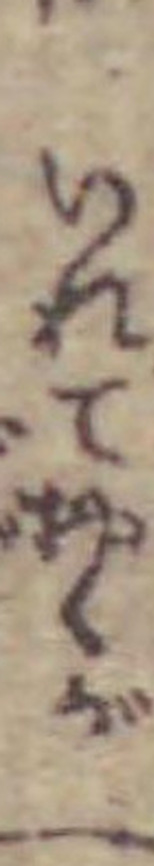いれておくが
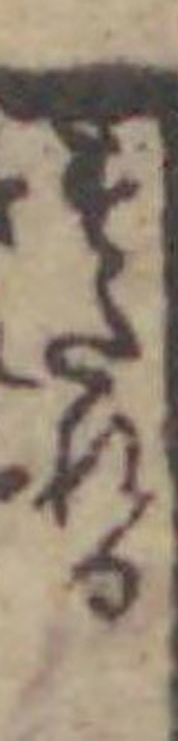すたれる
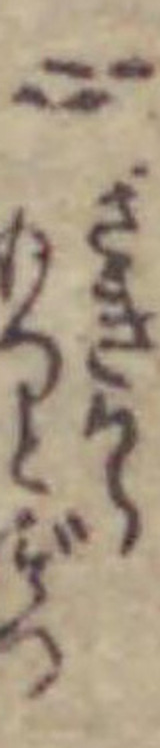もつとづつ
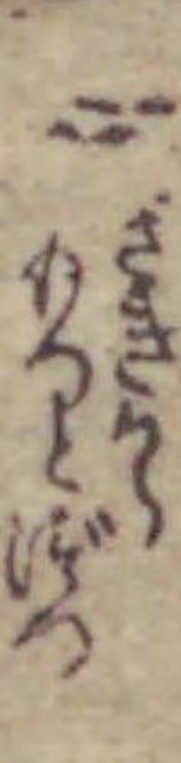もつとづつ

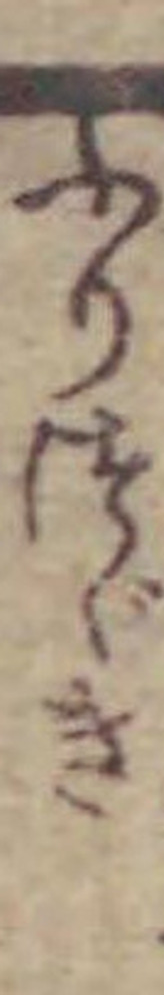ふりつゞき
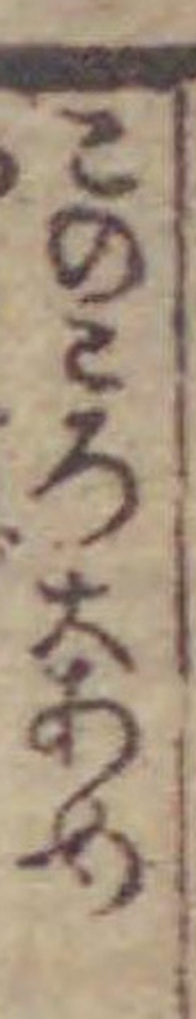このころ大あめ
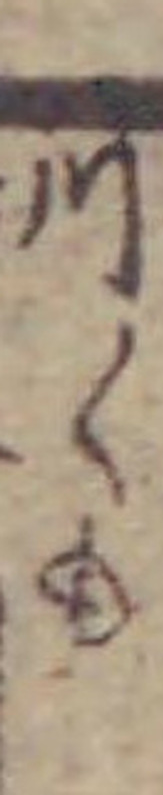川くも
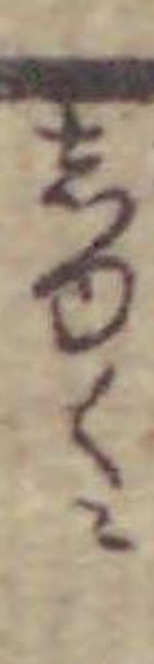しゆくに
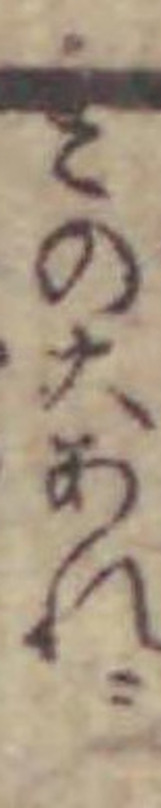この大あれに
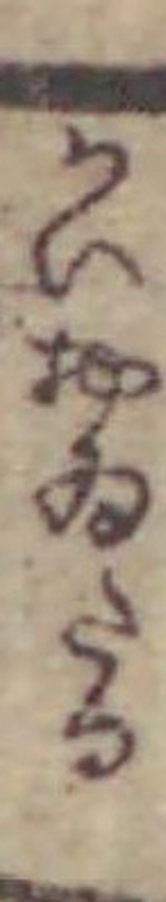かいおゐたる
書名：莫切自根金生木 : 3巻
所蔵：国立国会図書館 National Diet Library, JAPAN
